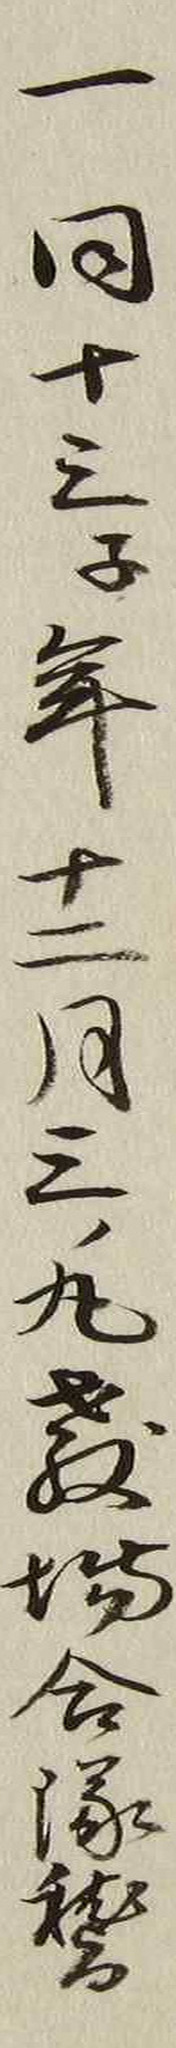一同十三子年十二月三ノ丸教場合隊稽
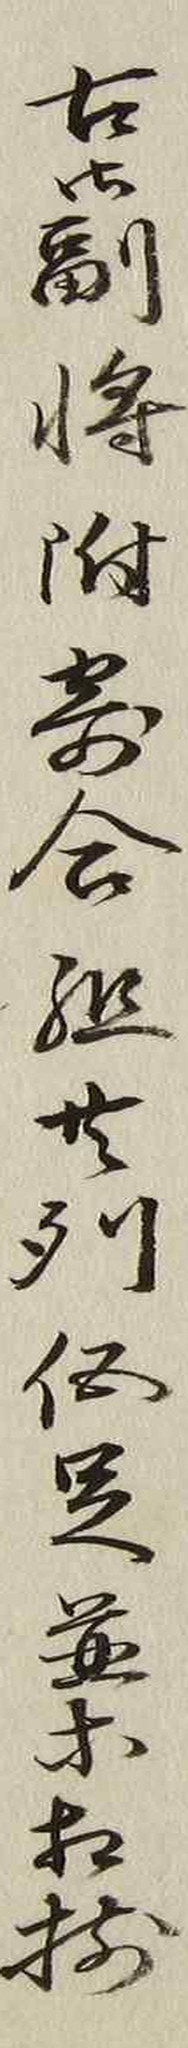古御副将附寄合組共列伍足並等相揃
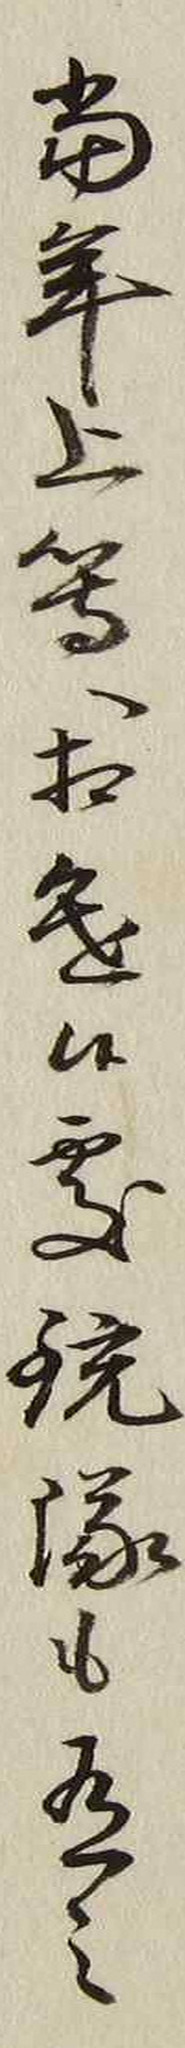当年上等へ相遣候処銃隊も有之
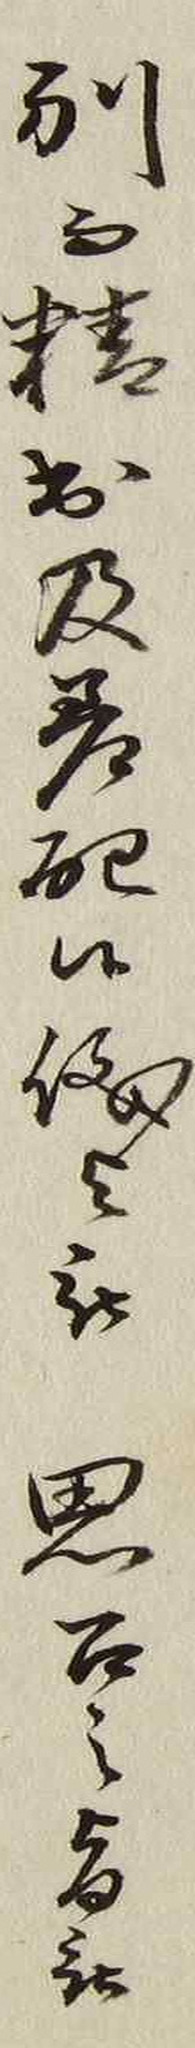別而精出及差配候儀と被思召之旨被
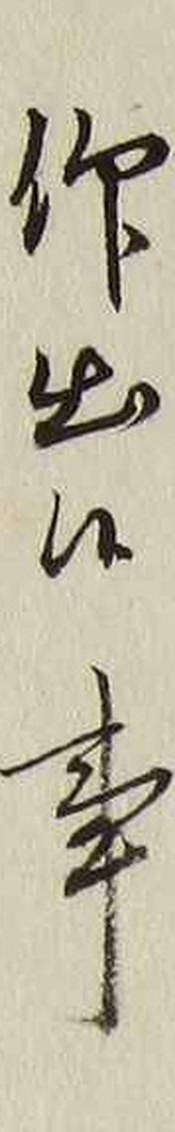仰出候事
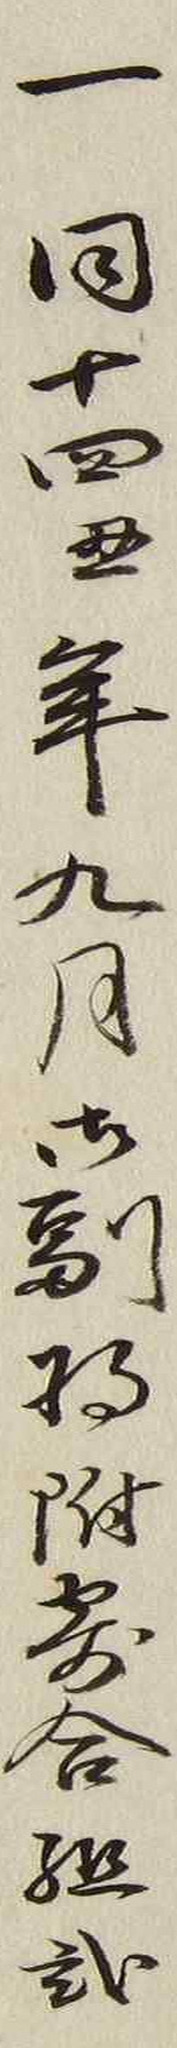一同十四丑年九月御副将附寄合組弐
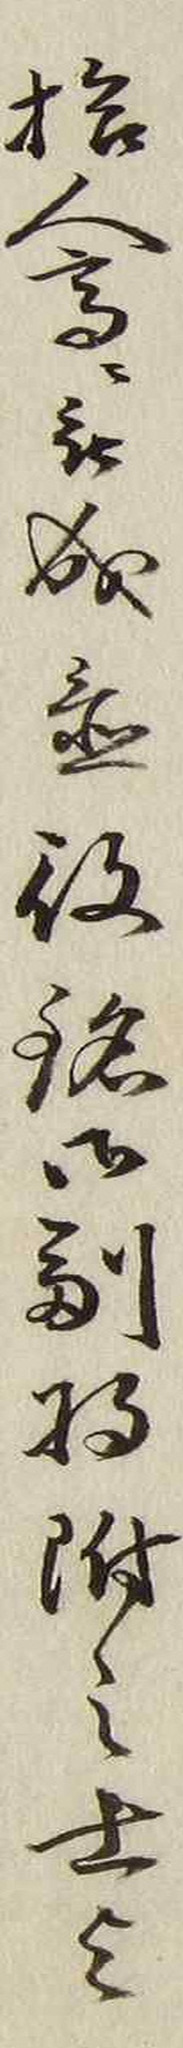拾人高ニ被成置役銘御副将附之士と

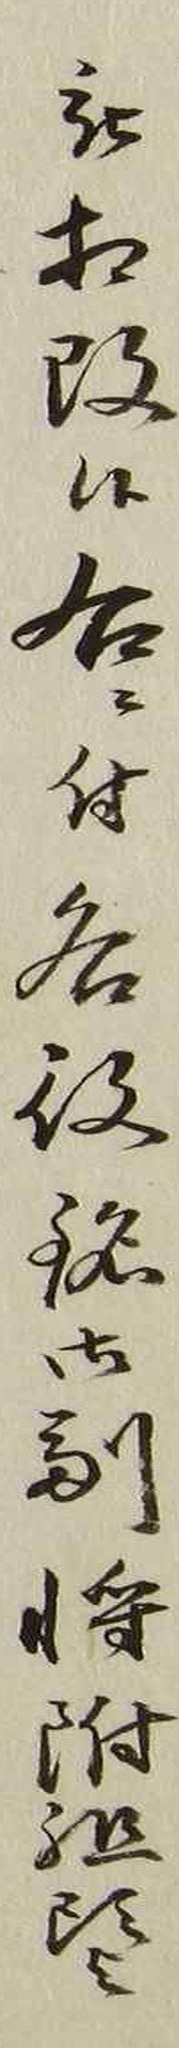被相改候右ニ付各役銘御副将附組頭と
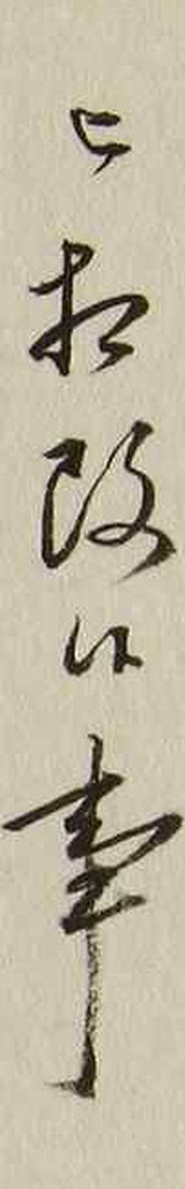被相改候事
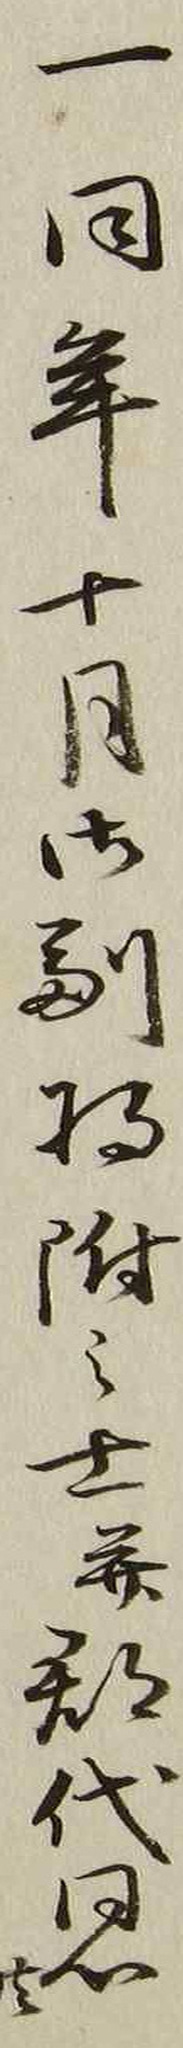一同年十月御副将附之士并郡代同心共
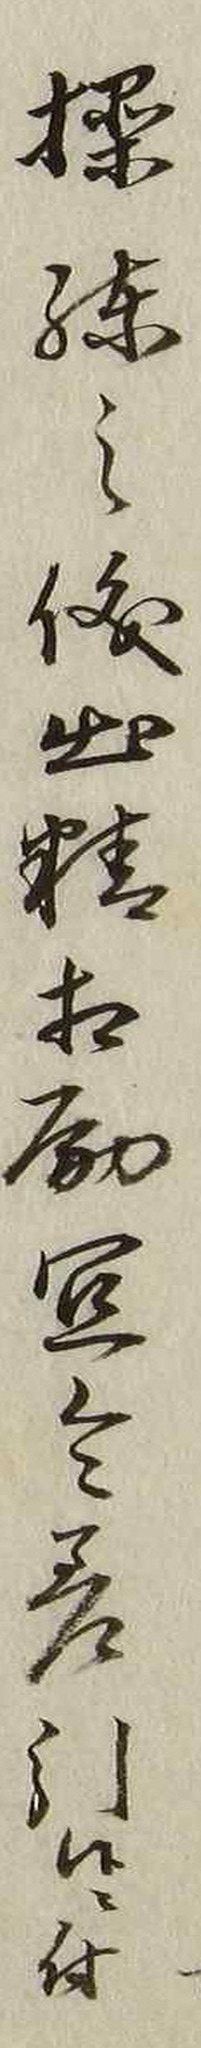操練之儀出精相励宜令差引候ニ付
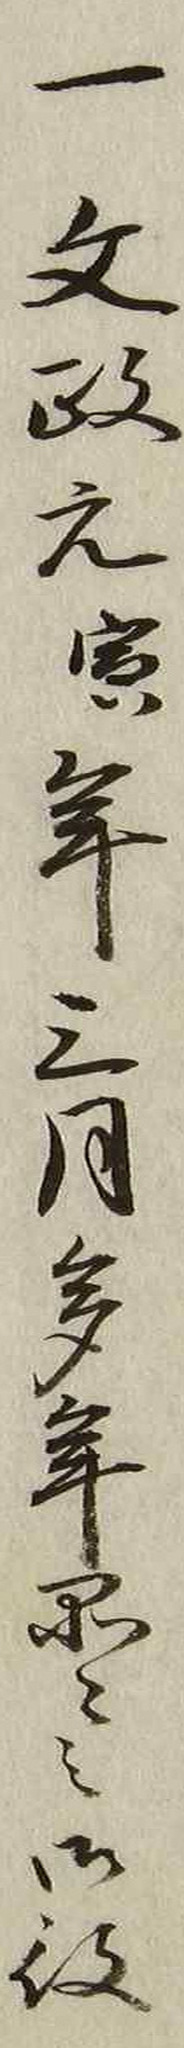一文政元寅年三月多年品々之御役
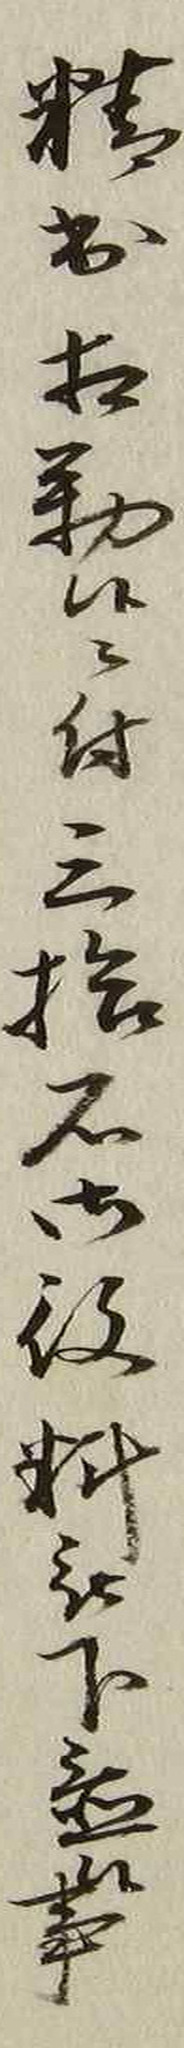精出相勤候ニ付三拾石御役料被下置候事
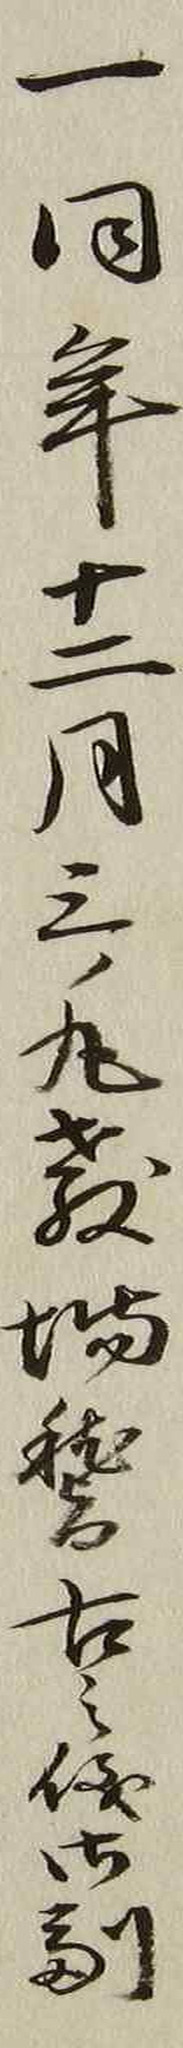一同年十二月三ノ丸教場稽古之儀御副
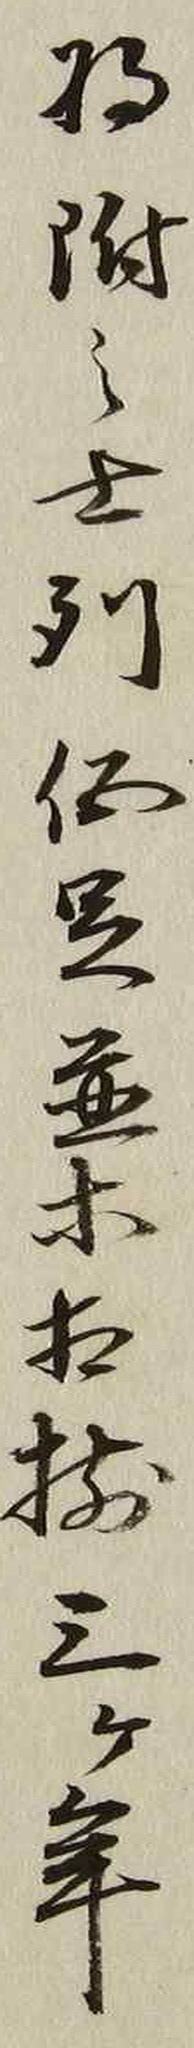将附之士列伍足並等相揃三ケ年
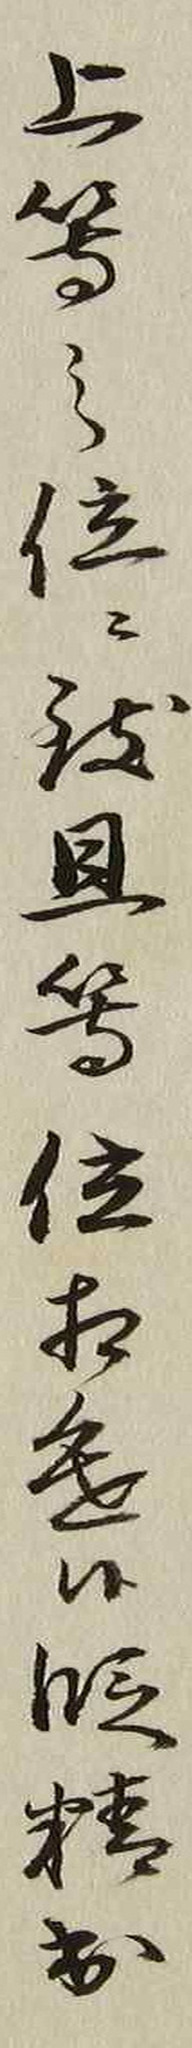上等之位ニ致且等位相遣候段精出
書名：諸士系譜　巻之160　な之部2
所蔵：会津若松市立会津図書館
